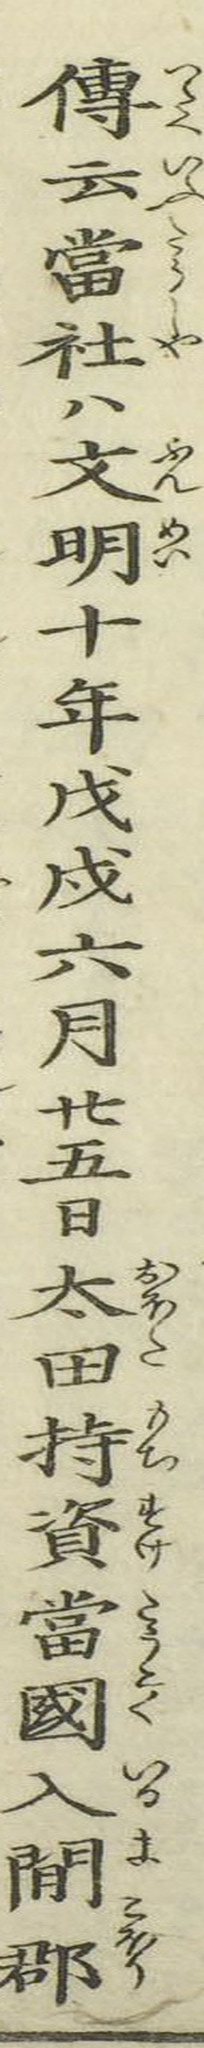傳云當社は文明十年戊戌六月廿五日太田持資當國入間郡
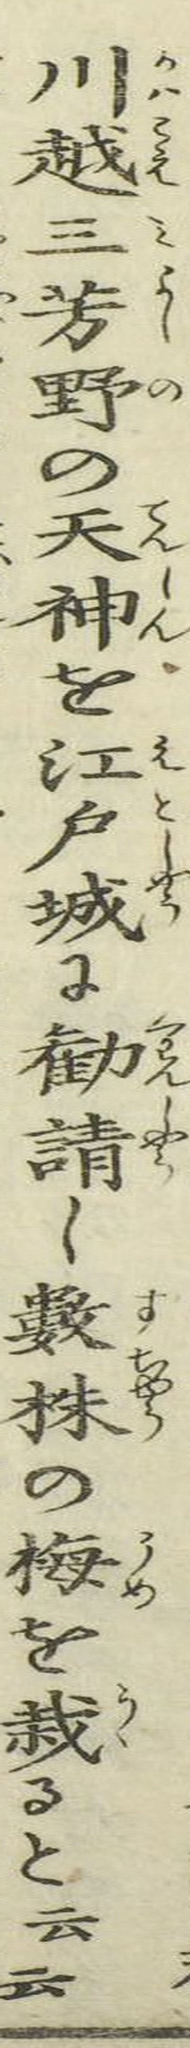川越三芳野の天神を江戸城に勧請し數株の梅を栽ると云云
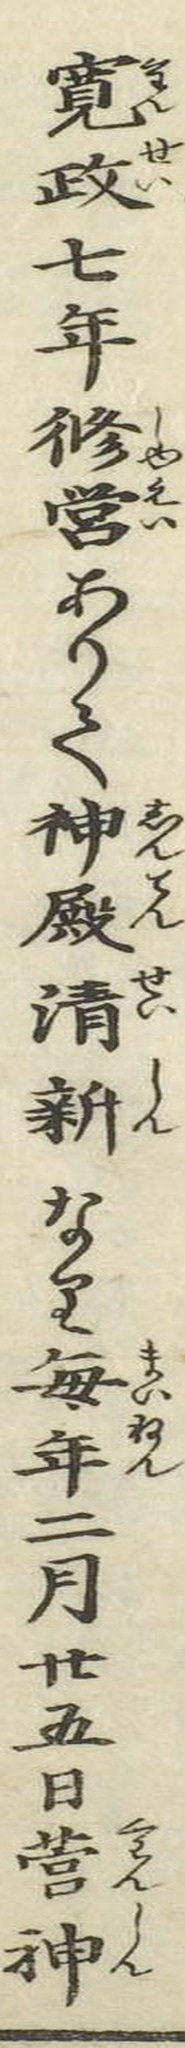寛政七年修営ありて神殿清新なり毎年二月廿五日菅神
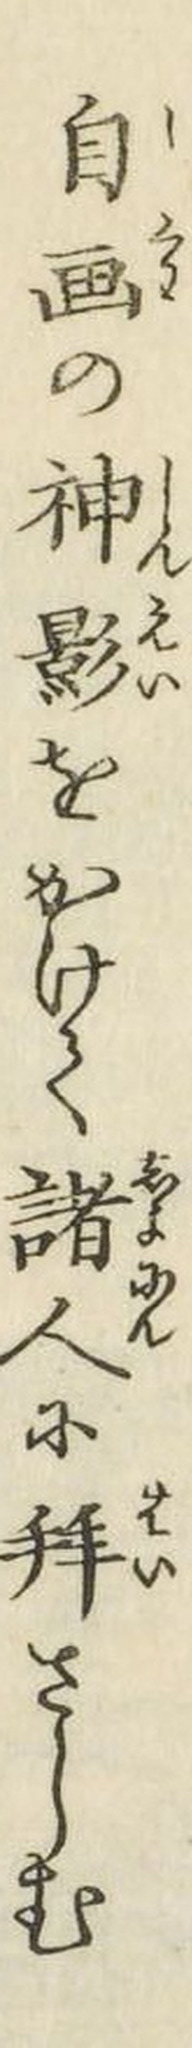自画の神影をかけて諸人に拜さしむ
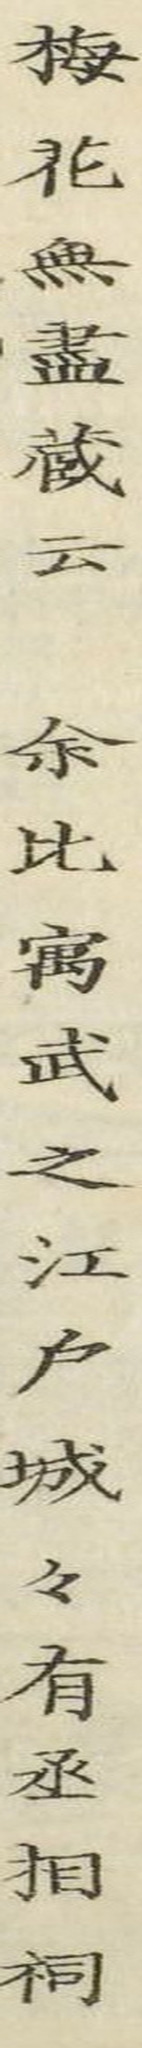梅花無盡藏云余比寓武之江戸城々有丞相祠
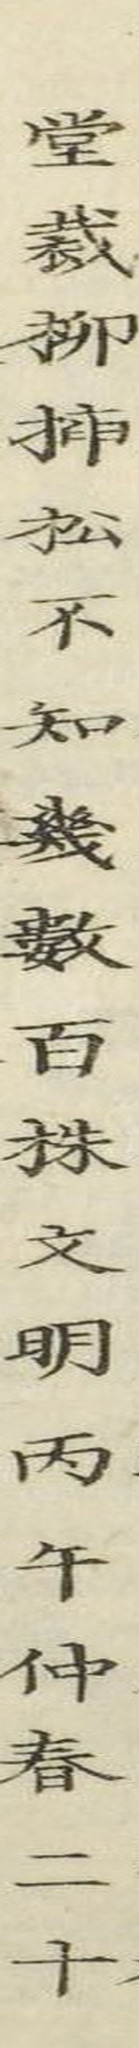堂裁柳挿松不知幾數百株文明丙午仲春二十
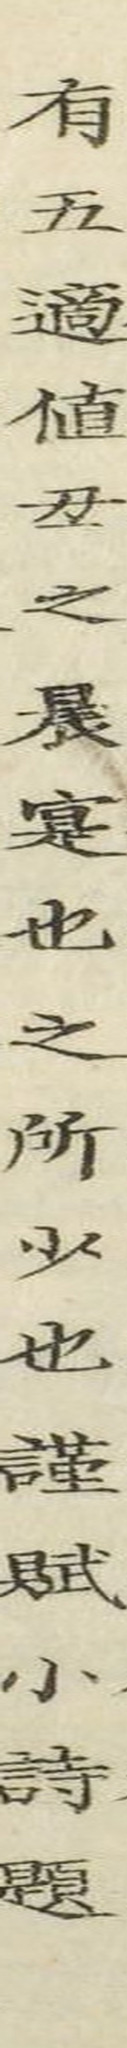有五適値丑之晨寔也之所少也謹賦小詩題
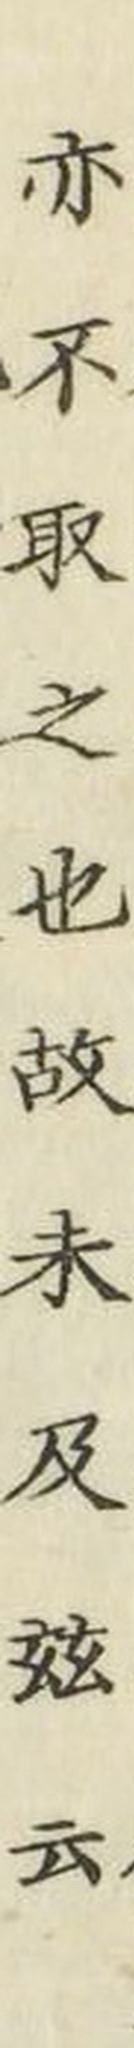亦不取之也故未及玆云
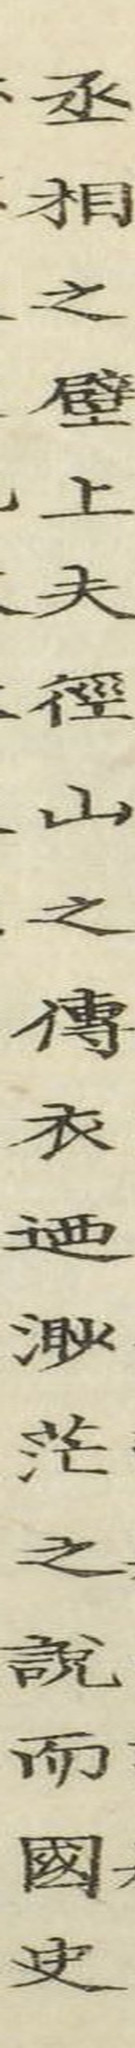丞相之壁上夫徑山之傳衣迺渺茫之説而國史
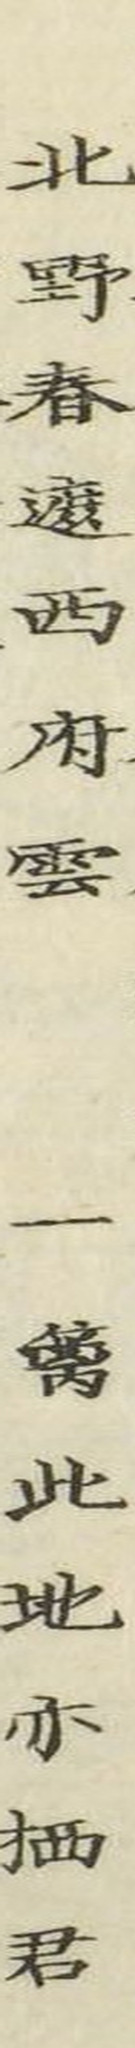北野春遮西府雲一篱此地亦栖君
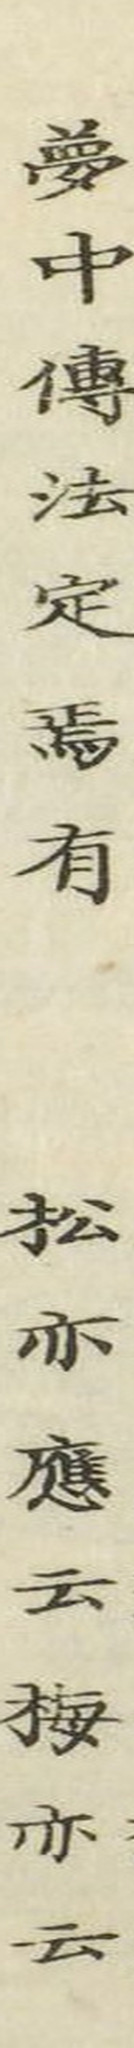夢中傳法定焉有松亦應云梅亦云
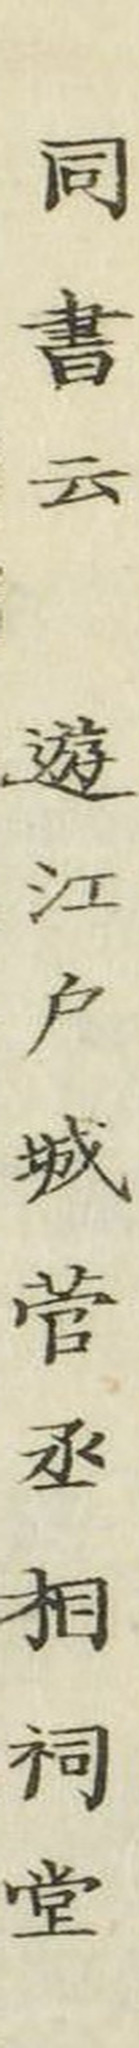同書云遊江戸城菅丞相祠堂
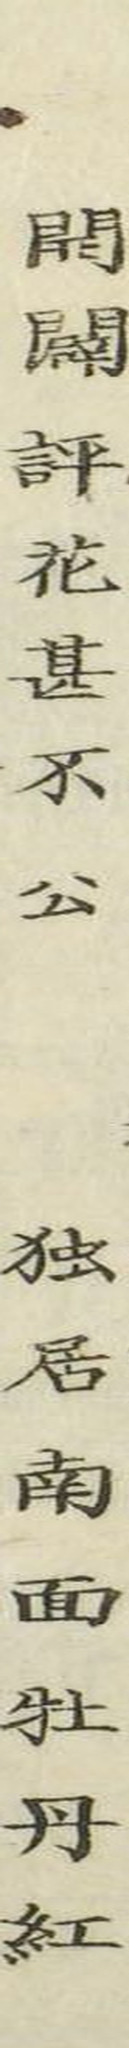開闢評花甚不公独居南面牡丹紅
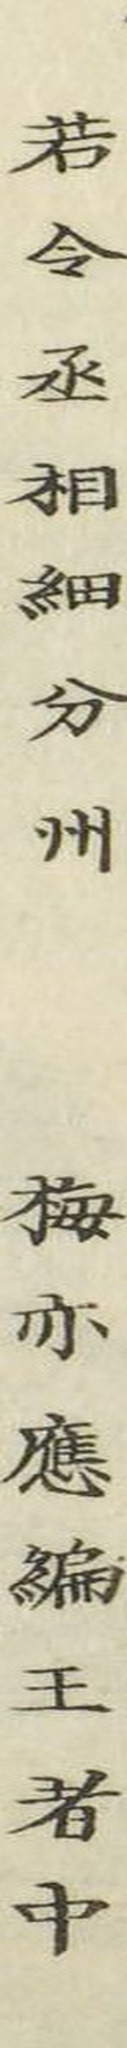若令丞相細分州梅亦應編王者中
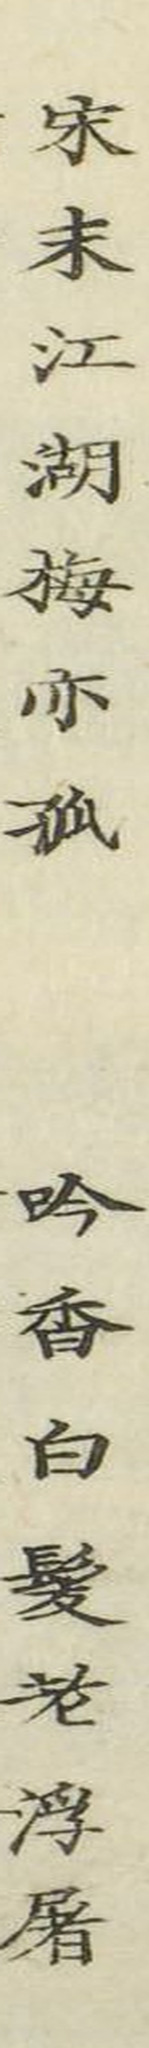宋末江湖梅亦孤吟香白髪老浮屠
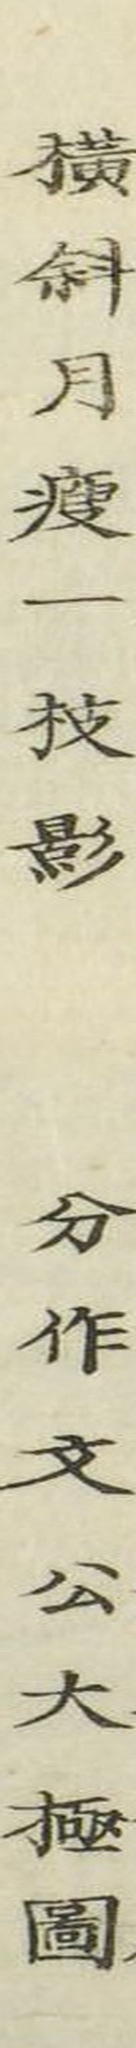横斜月痩一枝影分作文公大極圖
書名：江戸名所図会 20巻 巻之7
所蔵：東京学芸大学教育コンテンツアーカイブ
